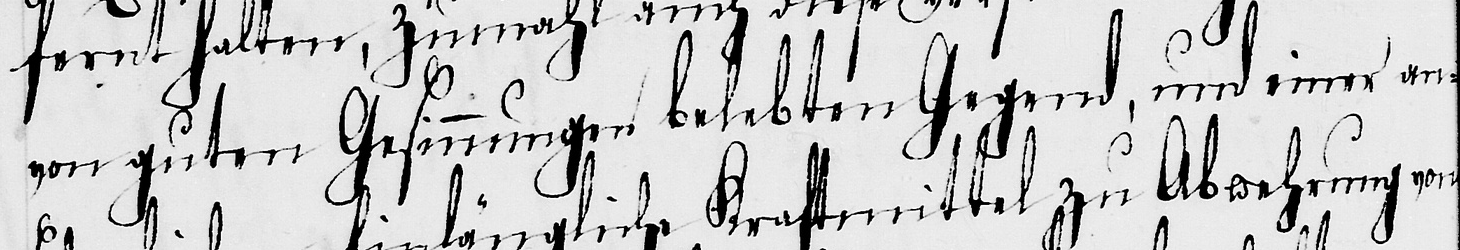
von guten Gesinnungen belebten Gegend, und einer a¬
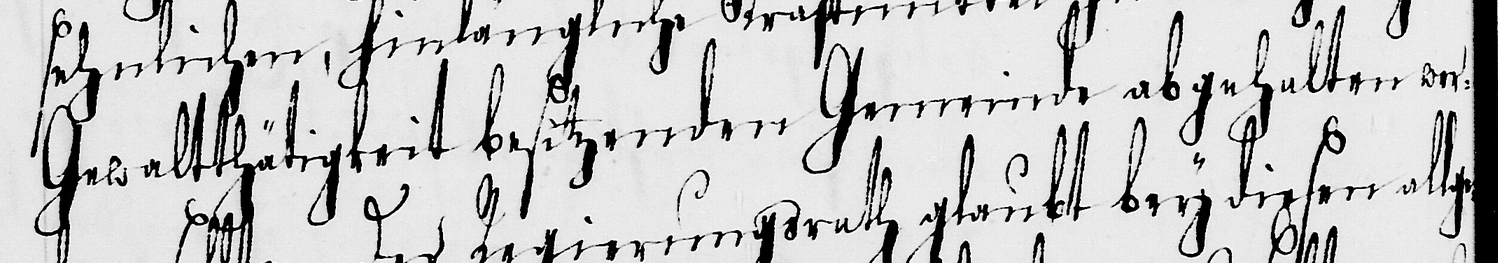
Gewaltthätigkeit besitzenden Gemeinde abgehalten wer¬
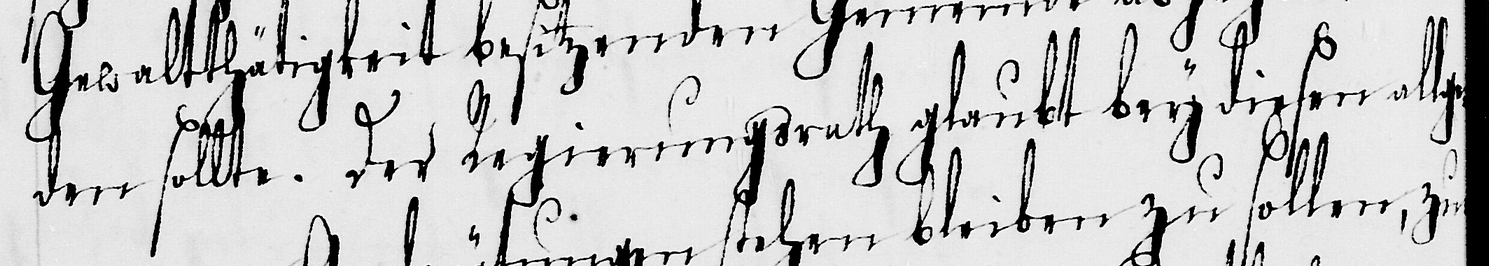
den sollte. Der Regierungsrath glaubt bey diesen al¬
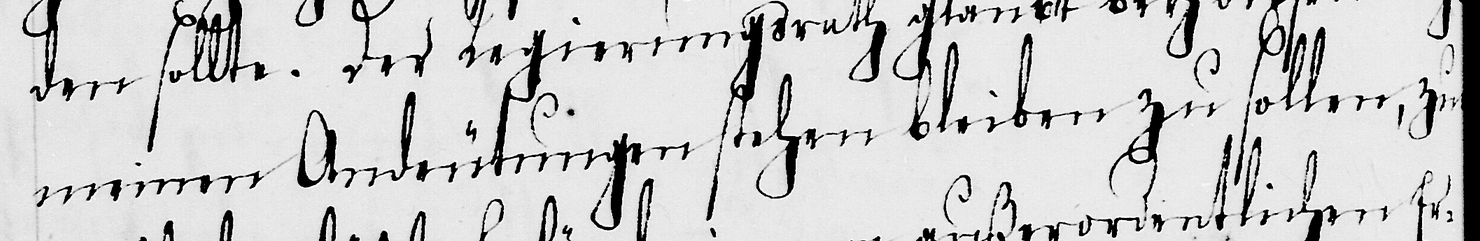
meinen Andeutungen stehen bleiben zu sollen, z¬
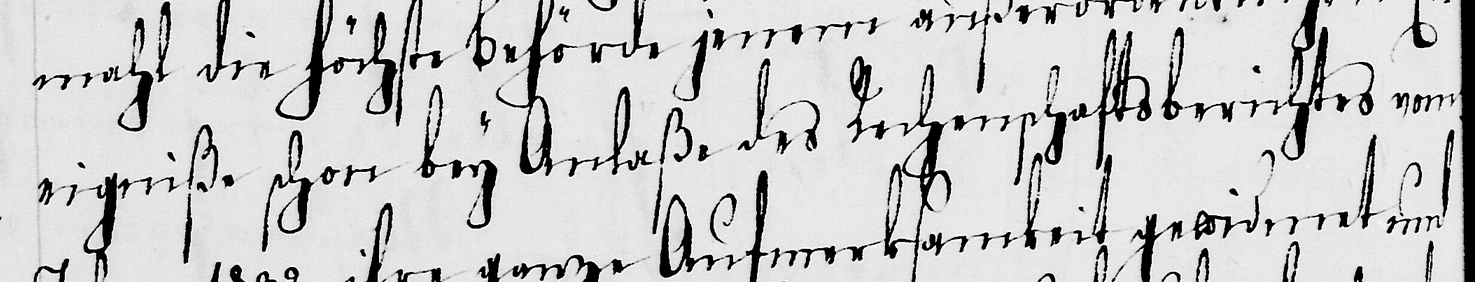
eigniße schon bey Anlaße des Rechenschaftsberichtes vom
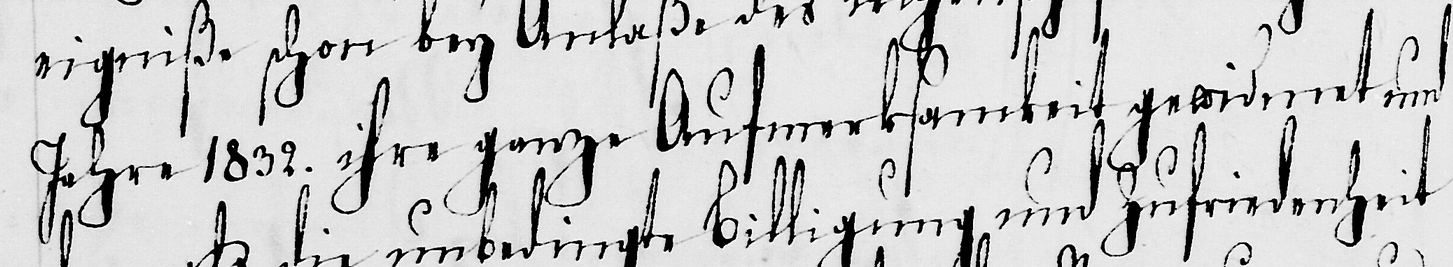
Jahre 1832. ihre ganze Aufmerksamkeit gewidmet und
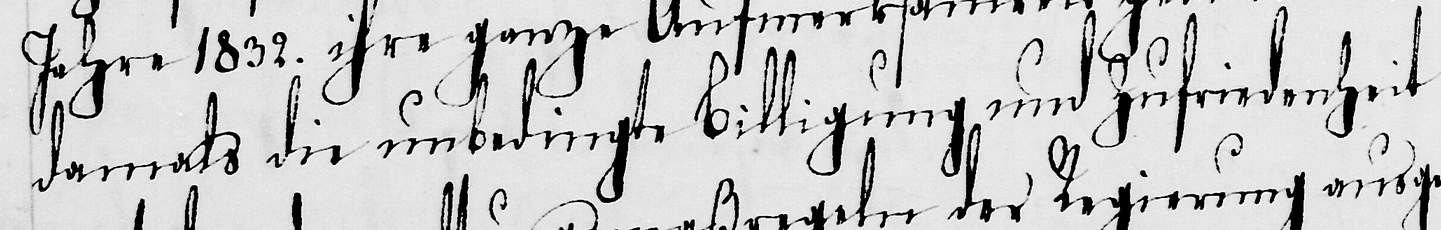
damals die unbedingte Billigung und Zufriedenheit
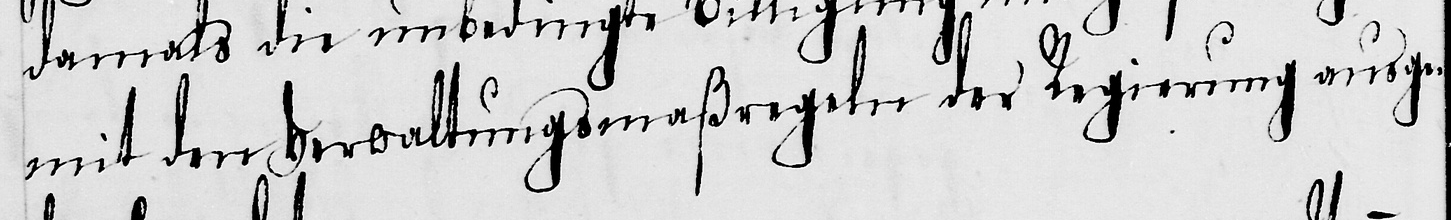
mit den Verwaltungsmaßregeln der Regierung ausg¬
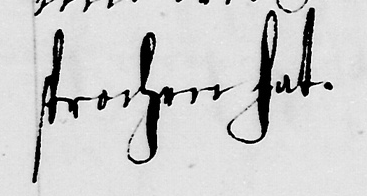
prochen hat.
